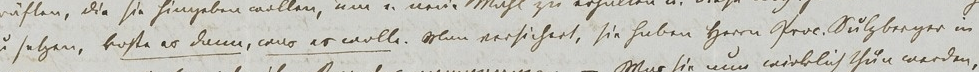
zu setzen, koste es dann, was es wolle. Man versichert, sie haben Herrn Proc. Sulzberger in
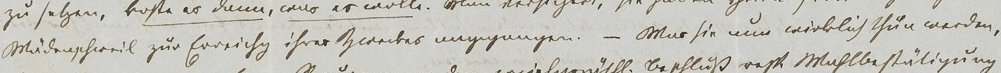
Wädenschweil zur Erreichg ihres Zweckes angegangen. – Was sie nun wirklich thun werden,
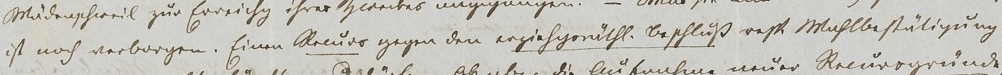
ist noch verborgen. Einen Recurs gegen den erziegsräthl. Beschluß resp. Wahlbestätigung
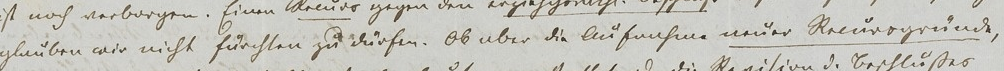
glauben wir nicht fürchten zu dürfen. Ob aber die Aufnahme neuer Recursgründe,
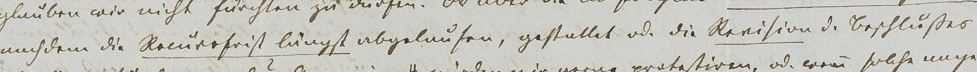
nachdem die Recursfrist längst abgelaufen, gestattet od. die Revision d. Beschlusses
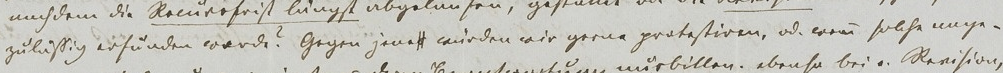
zulässig erfunden werde? Gegen jene würden wir gerne protestiren, od. wenn solche ange-
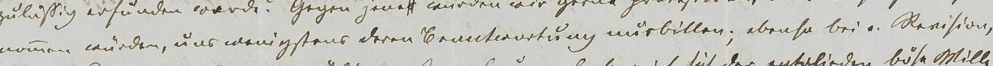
nommen würden, uns wenigstens deren Beantwortung ausbitten; ebenso bei e. Revision,
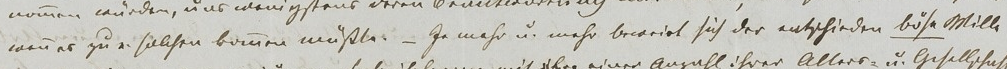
wenn es zu e. solchen kommen müßte. – Je mehr und mehr beweist sich der entschieden böse Wille
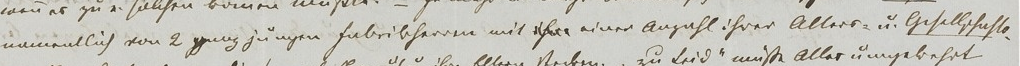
namentlich von 2 ganz jungen Fabrikherren mit einer Anzahl ihrer Alters- u. Gesellschafts -
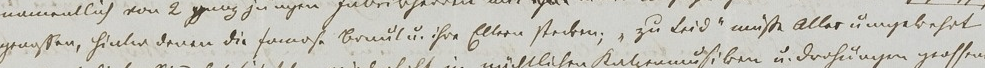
genossen, hinter denen die famose Braut u. ihre Eltern stecken; «zu Leid» müsste Alles umgekehrt
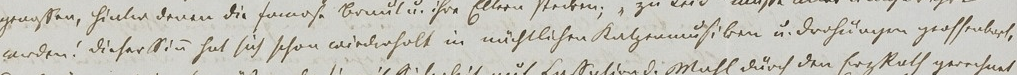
werden! Dieser Sinn hat sich schon wiederholt in nächtlichen Katzenmusiken u. Drohungen geoffenbart,
